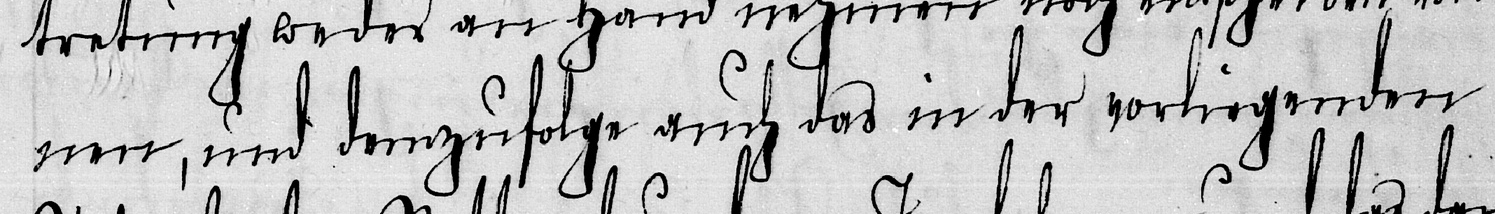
nen, und demzufolge auch das in der vorliegenden
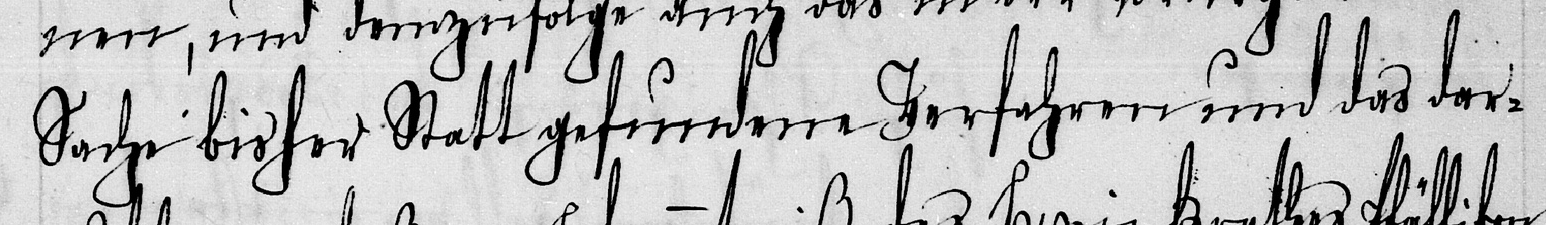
Sache bisher Statt gefundene Verfahren und das dar¬
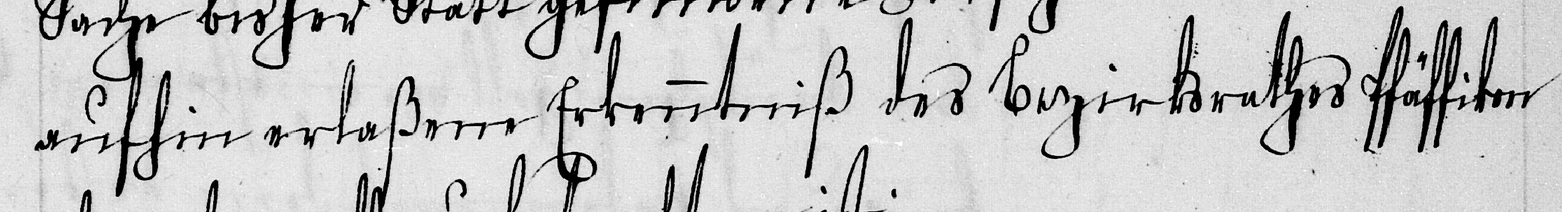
aufhin erlaßene Erkenntniß des Bezirksrathes Pfäffikon
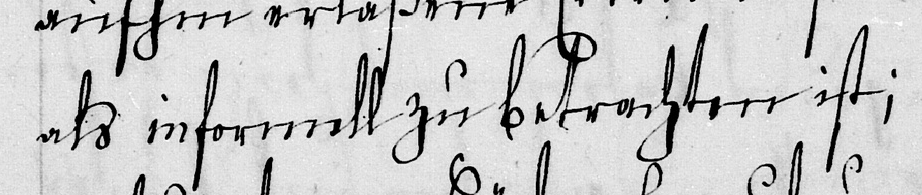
als informell zu betrachten ist;
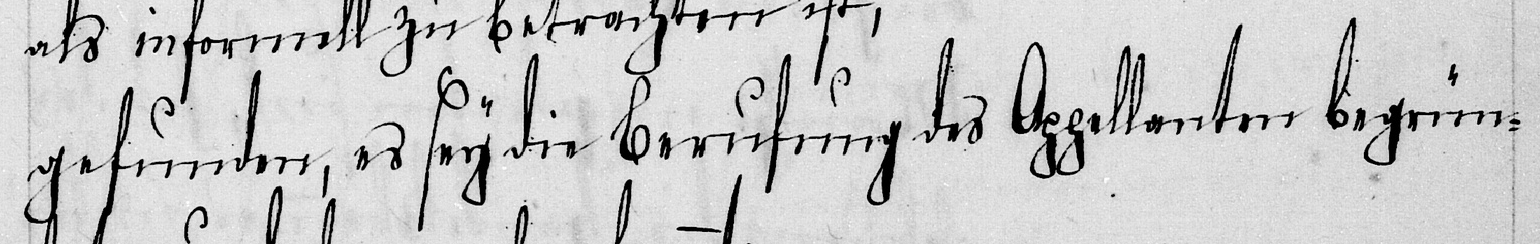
gefunden, es sey die Berufung des Appellanten
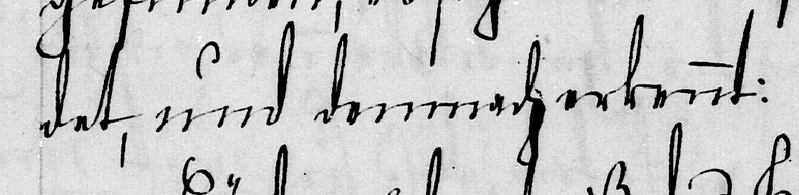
ndet, und demnach erkennt:
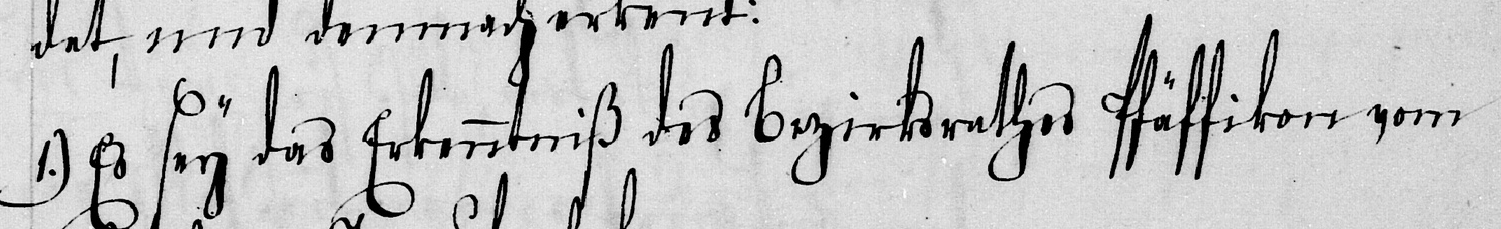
Es sey das Erkenntniß des Bezirksrathes Pfäffikon vom
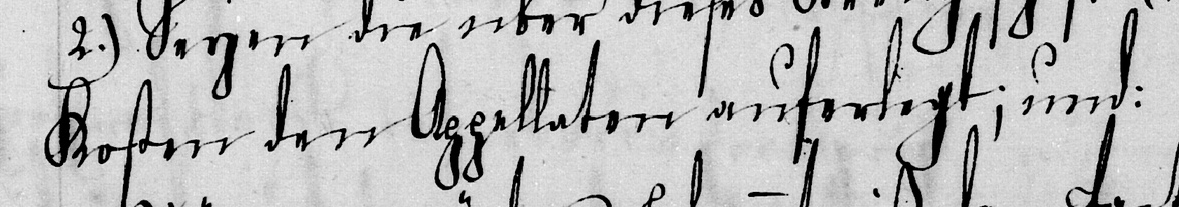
Kosten den Appellaten auferlegt; und
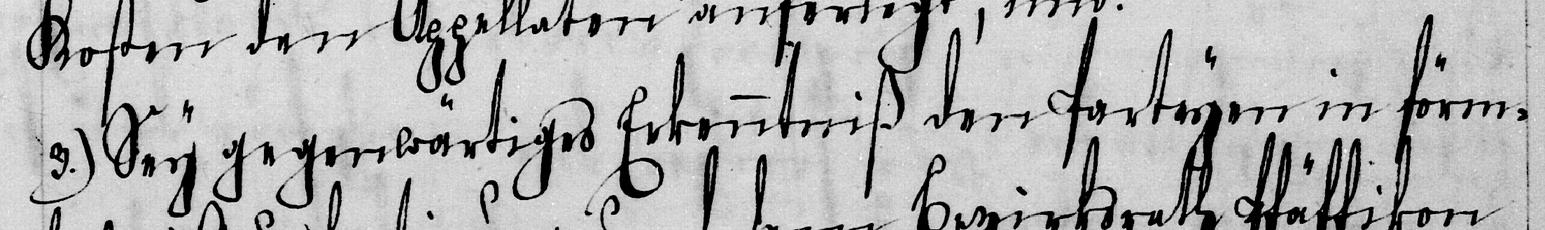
3.) Sey gegenwärtiges Erkenntniß den Parteyen in förm¬
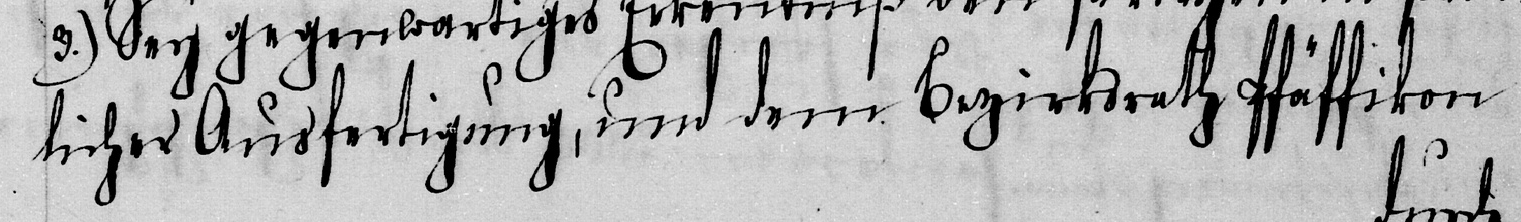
licher Ausfertigung, und dem Bezirksrath Pfäffikon
